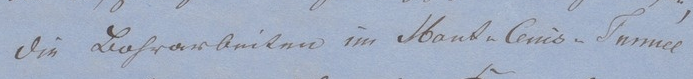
die Bohrarbeiten im Mont-Cenis-Tunnel
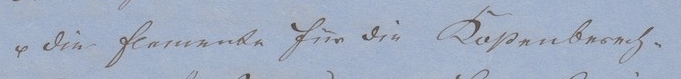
& die Elemente für die Kostenberech-
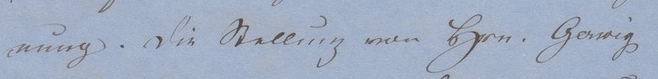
nung. Die Stellung von Hrn. Gerwig
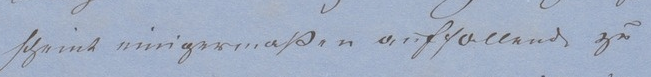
scheint einigermaßen auffallend zu
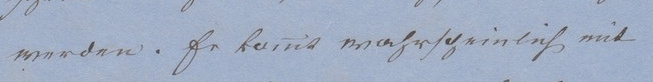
werden. Er kommt wahrscheinlich mit
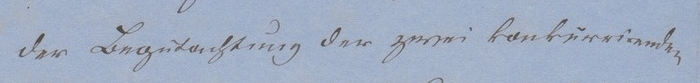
der Begutachtung der zwei konkurrirenden
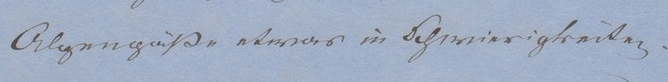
Alpenpäße etwas in Schwierigkeiten. –
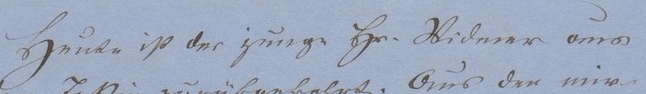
Heute ist der junge Hr. Widmer aus
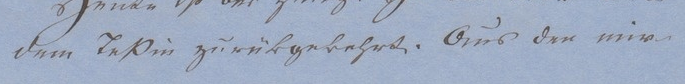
dem Teßin zurükgekehrt. Aus den mir
